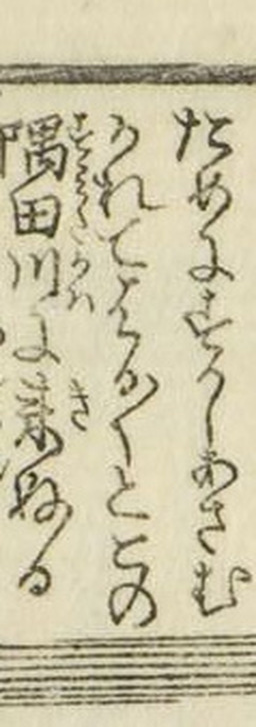かれてはる〳〵とこの
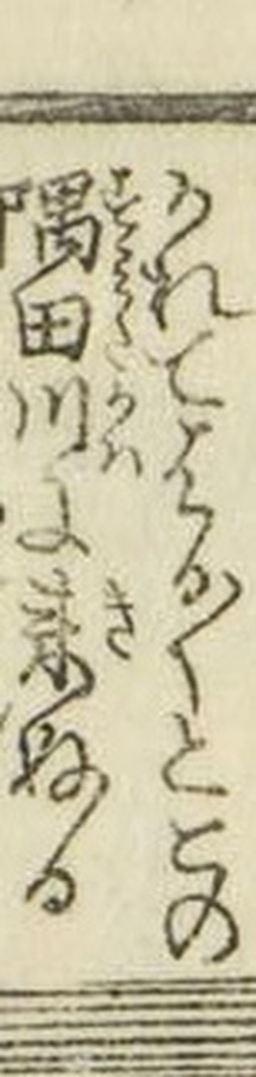隅田川に来ぬる
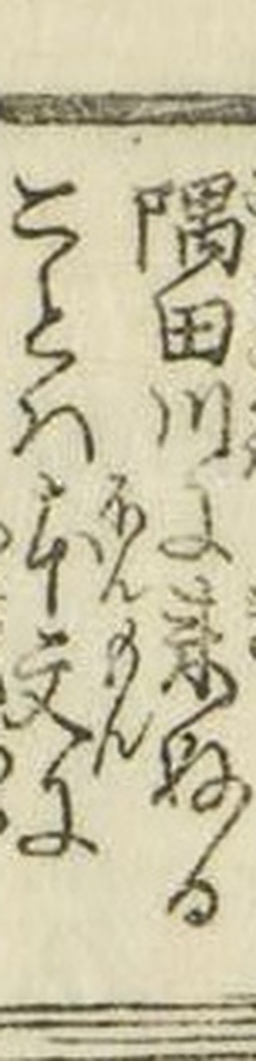ことは本文に
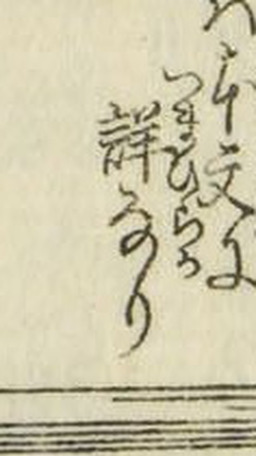詳なり
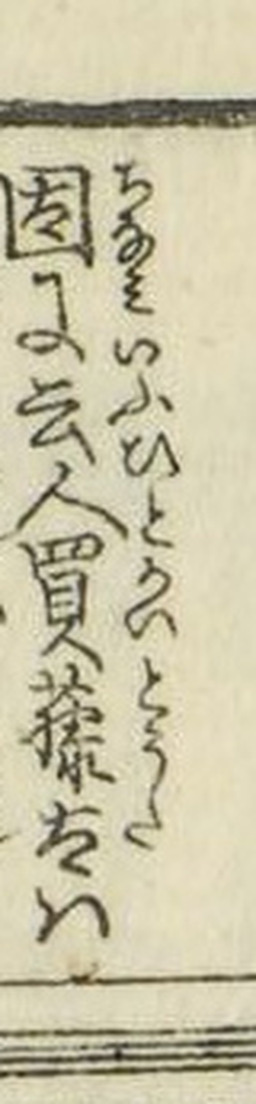因に云人買藤太は
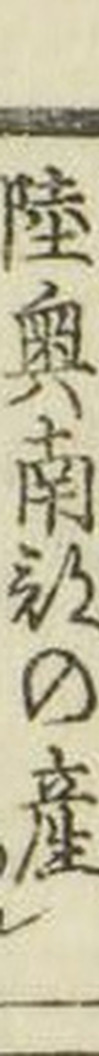陸奥南部の産
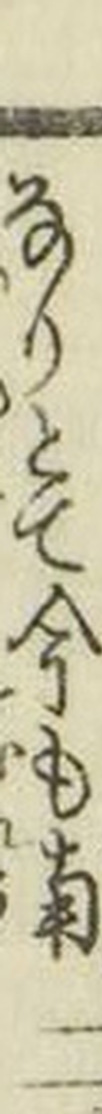なりとて今も南
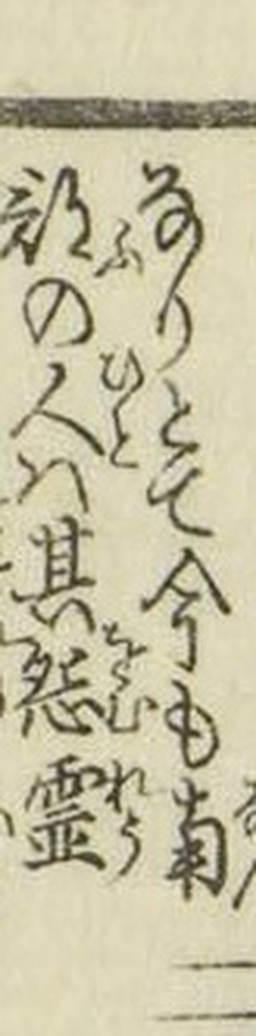部の人は其怨霊
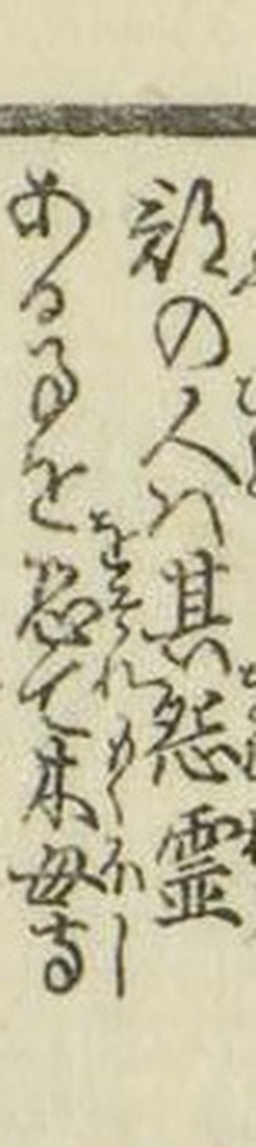ある事を恐て木母寺
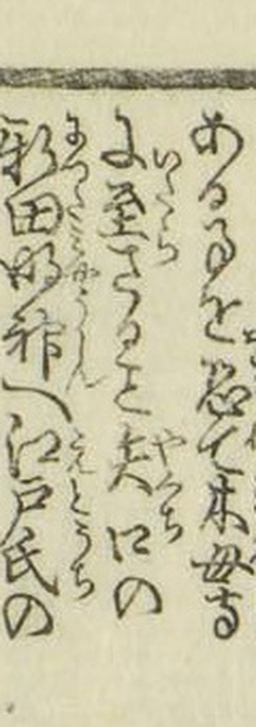に至さること矢口の
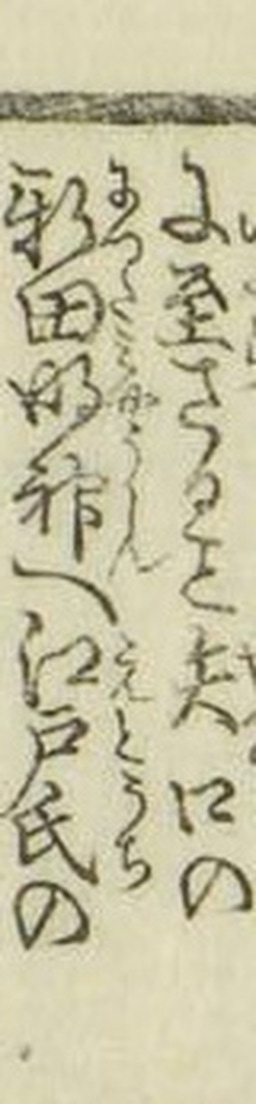新田明神へ江戸氏の
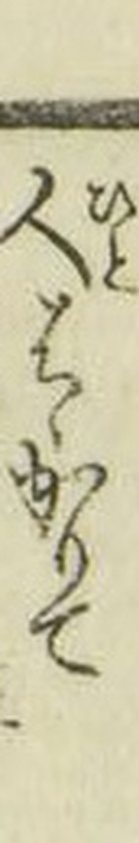人はゝかりて
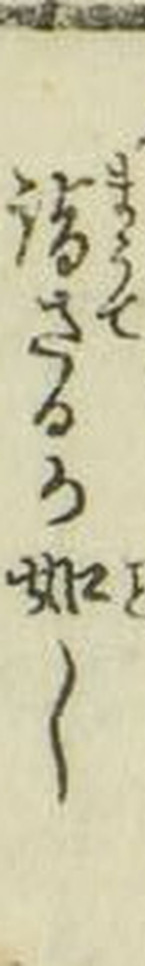詣さるか如し

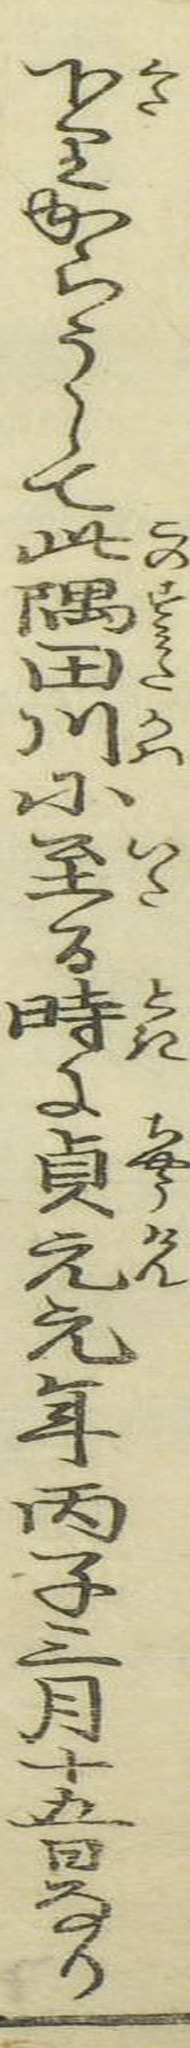下りからうして此隅田川に至る貞元元年丙子三月十五日なり
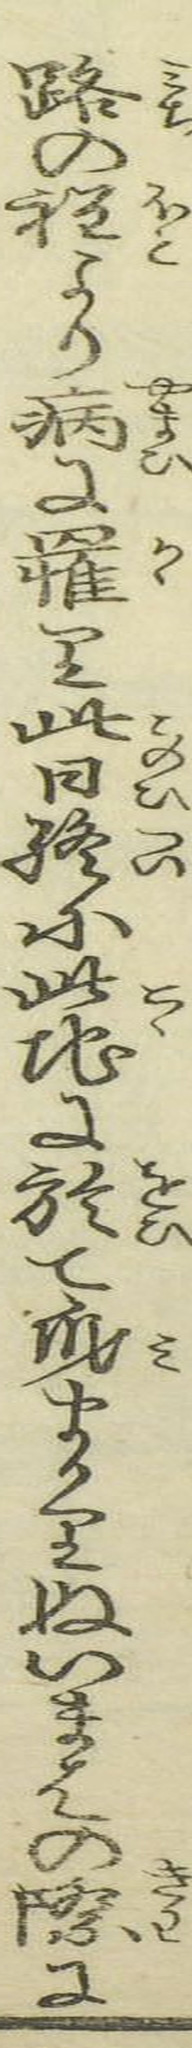路の程より病に罹り此日終に此地に於て身まかりぬいまはの際に
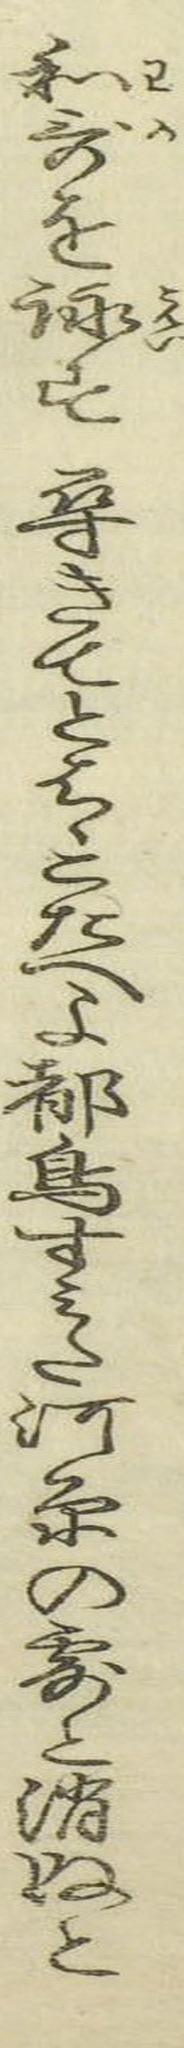和歌を詠す尋ねきてとはゝこたへよ都鳥すみた河原の露と消ぬと
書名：江戸名所図会 20巻 巻之19
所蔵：東京学芸大学教育コンテンツアーカイブ
